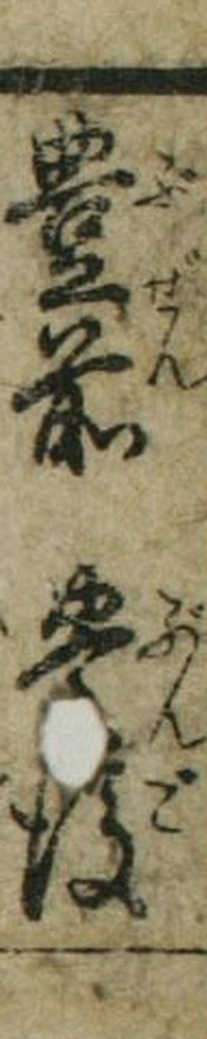豊前豊後
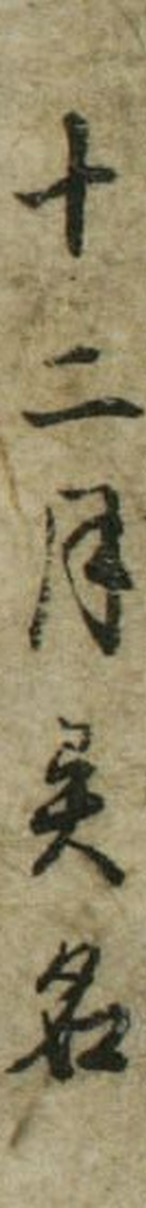十二月異名
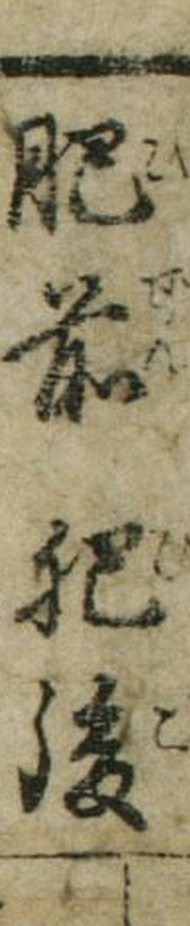肥前肥後
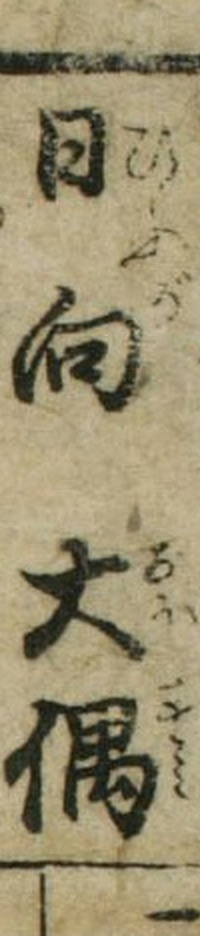日向大隅
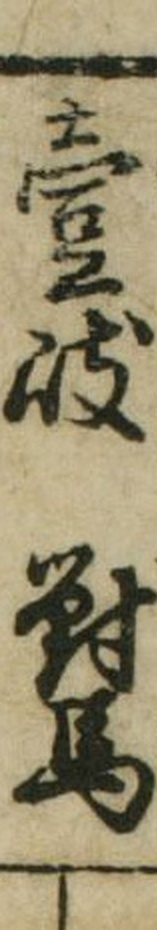壱岐対馬
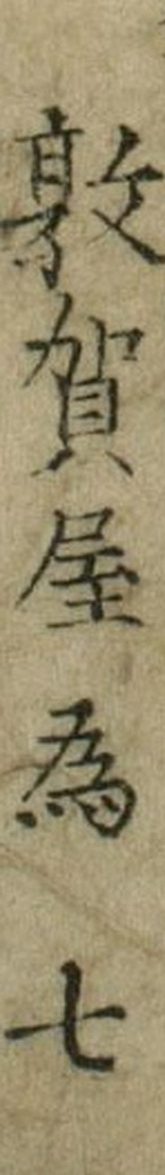敦賀屋為七
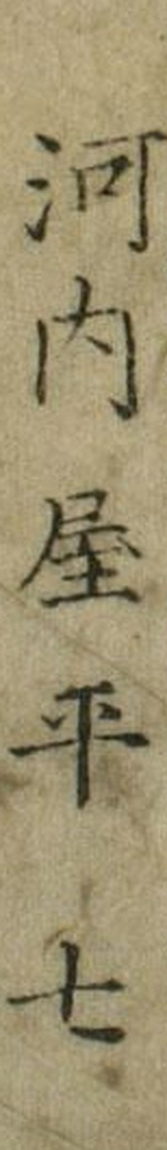河内屋平七
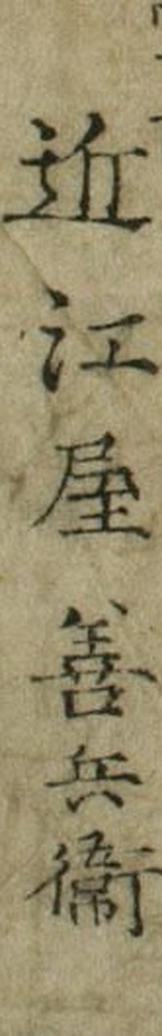近江屋善兵衛
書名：百人一首
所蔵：東京学芸大学教育コンテンツアーカイブ
